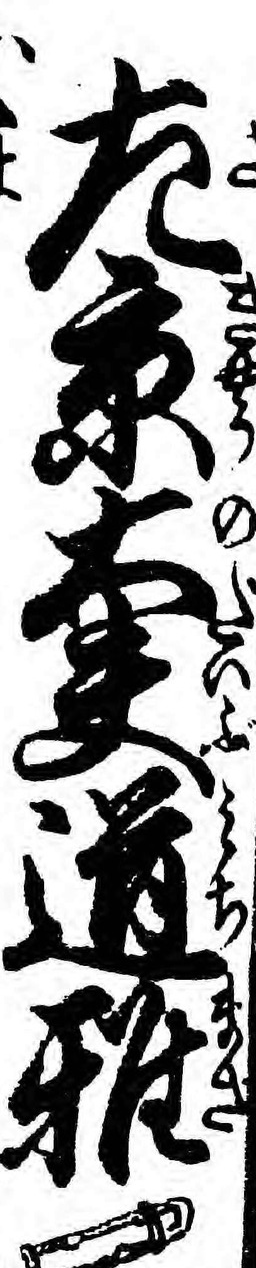左京大夫通雅
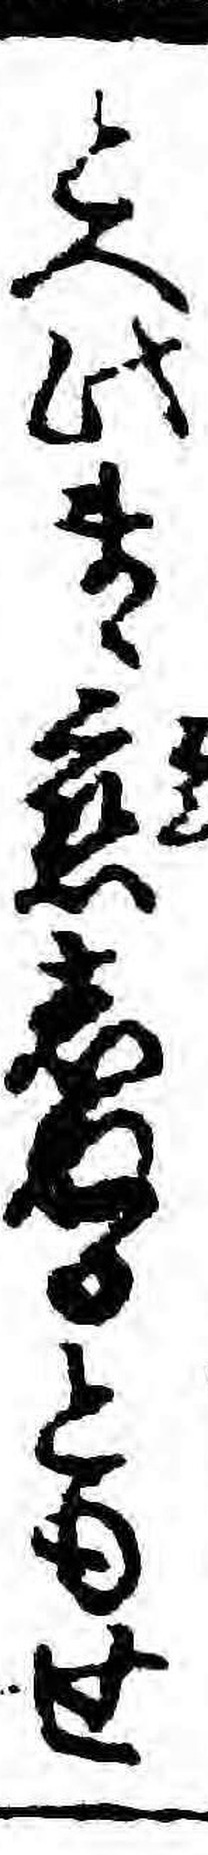とへ此まゝ恋しぬるともせ
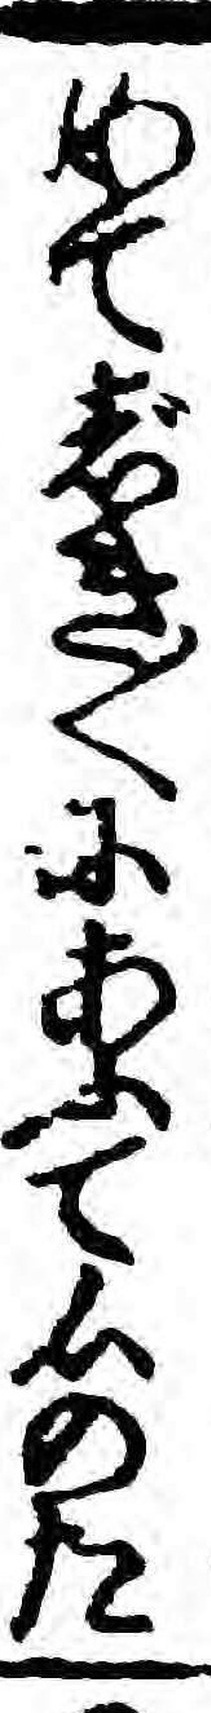めてじき〳〵にあふて心のた
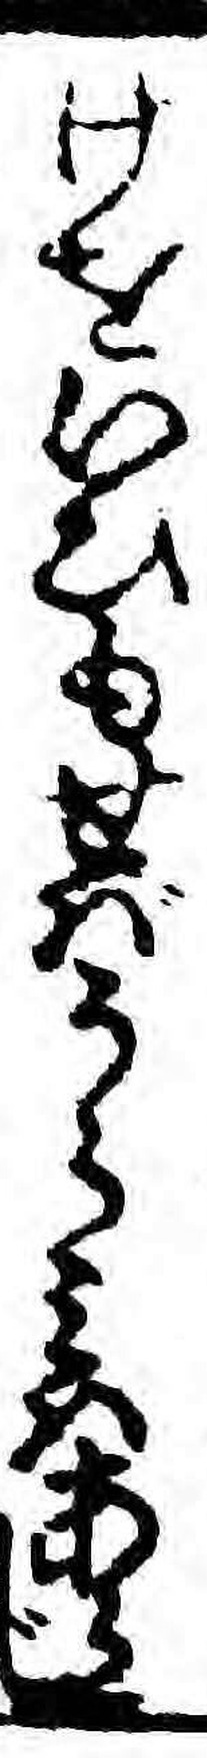けもいひもせばうらみはあらじ
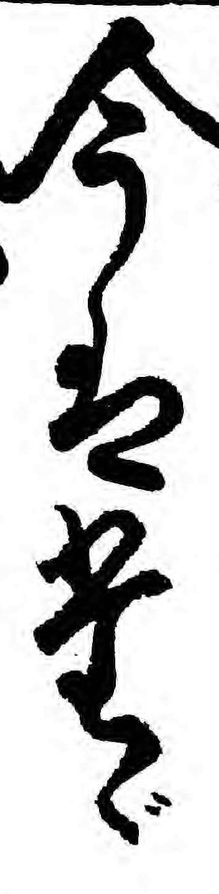今はたゞ
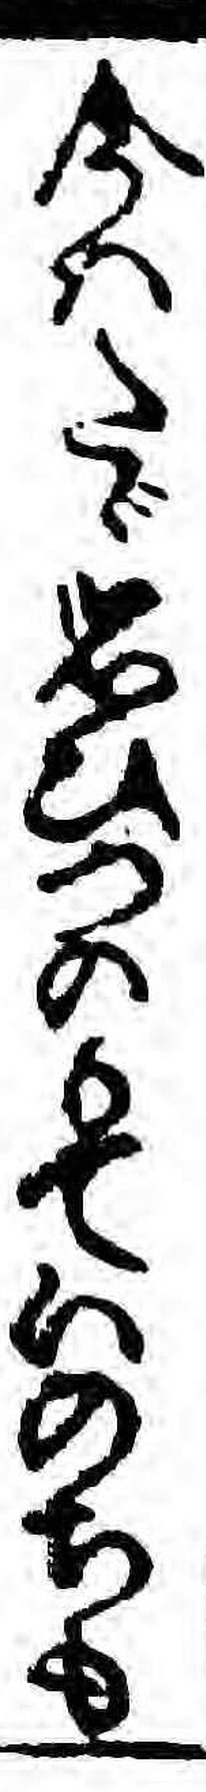今はたゞ思ひつのりていのちも
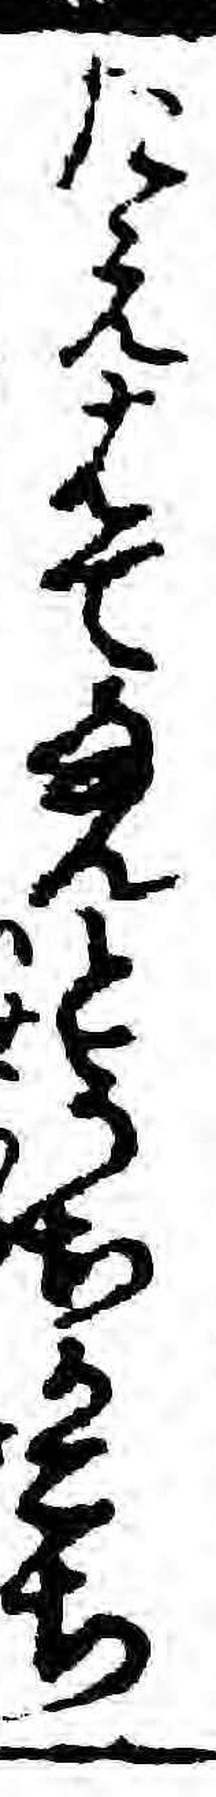たえはてなんとうちかこち
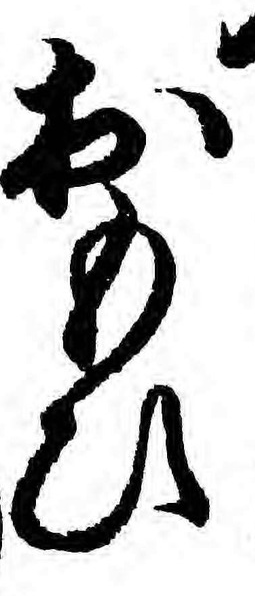おもひ
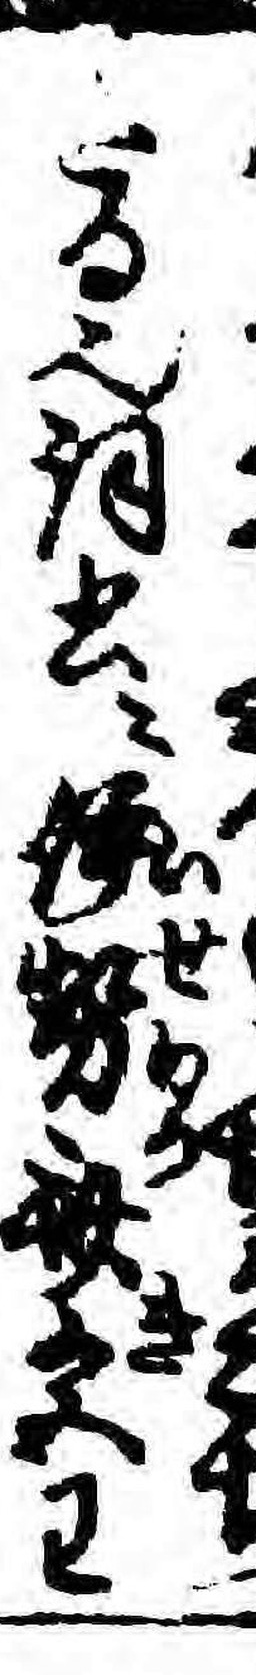たる也詞書に伊勢斎宮わ
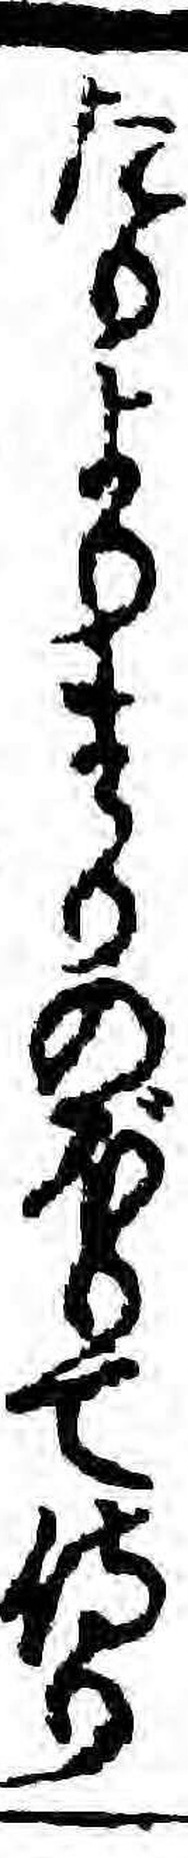たりよりまかりのぼりて侍り
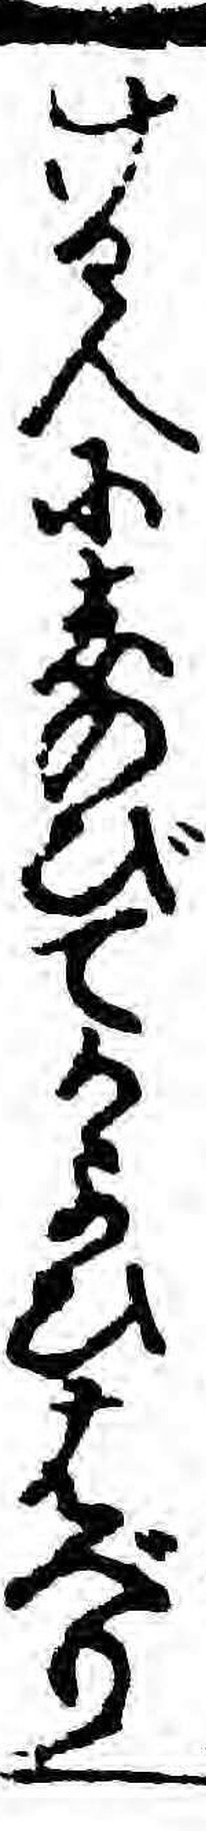ける人にしのびてかよひはべり
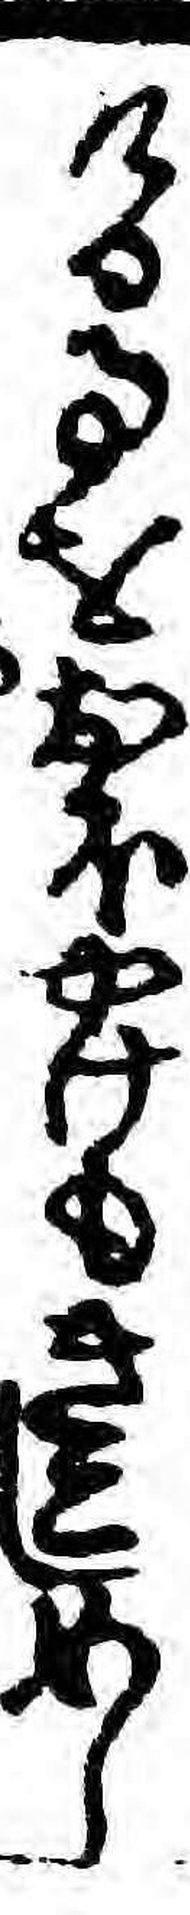ける事をおほやけもきこしめし
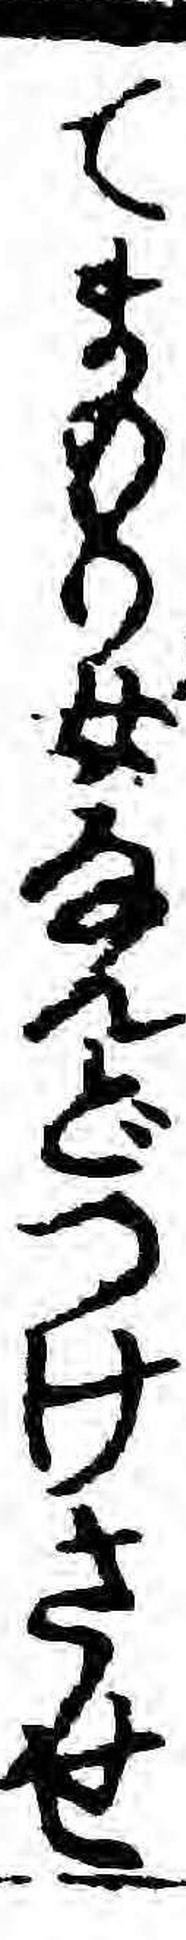てまもり女なんどつけさせ
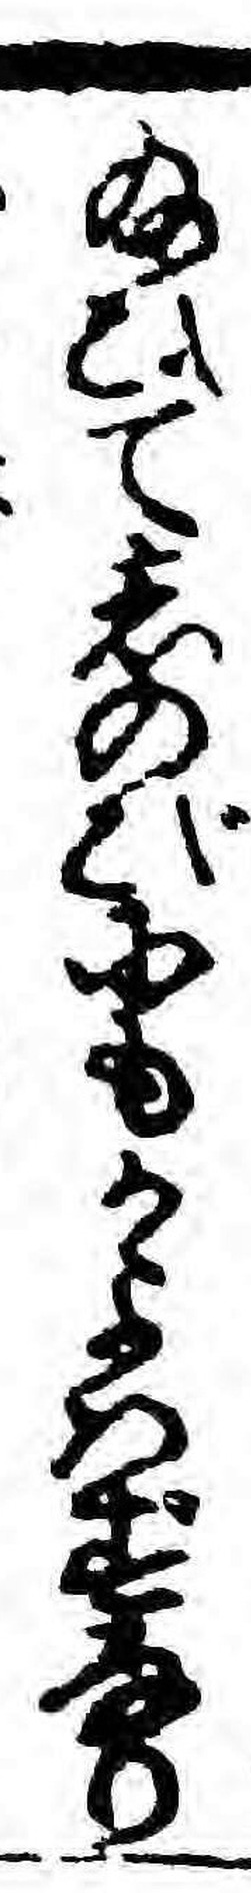給ひてしのびにもかよはずなり
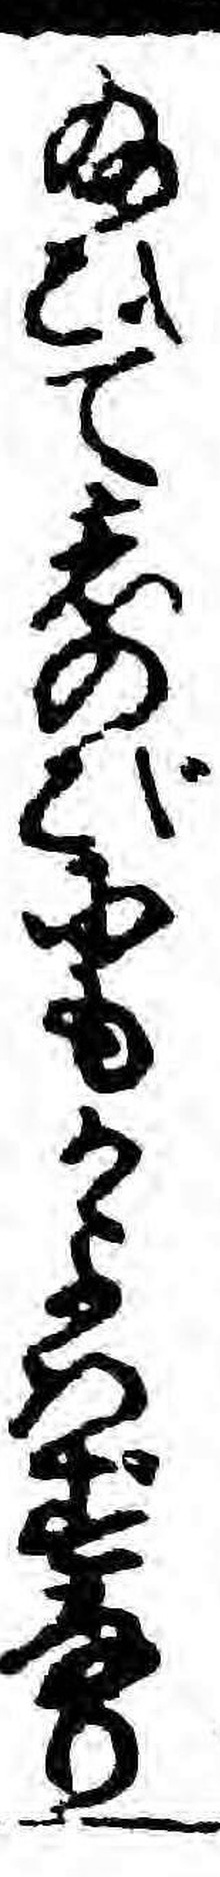給ひてしのびにもかよはずなり
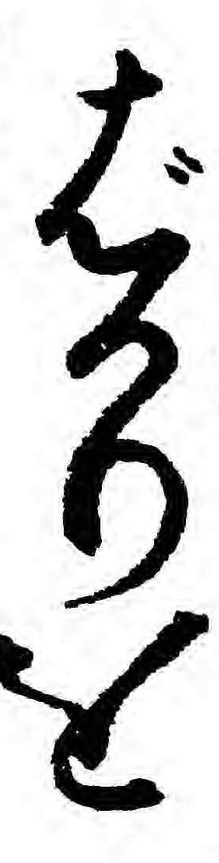ばかりを
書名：頭書和歌注譯／壽賀多百人一首小倉錦
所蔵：国文学研究資料館
